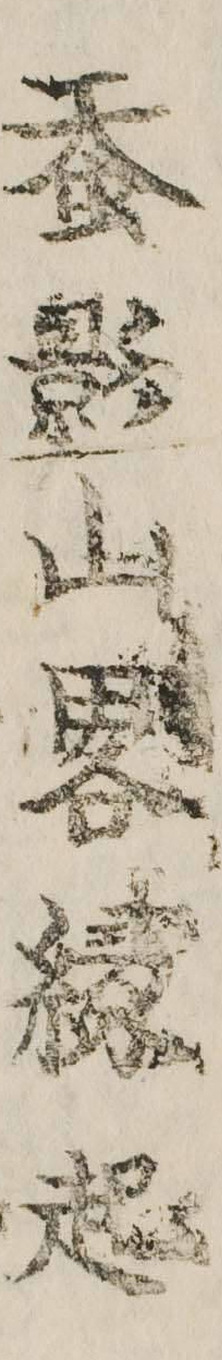蚕影山略縁起
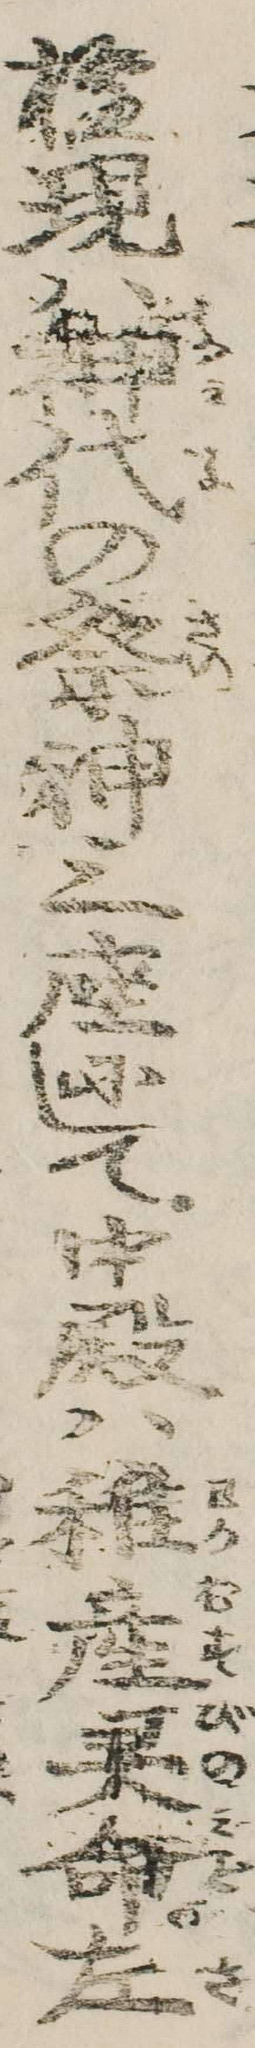権現は神代の祭神三座にして。中殿は稚産霊命。左
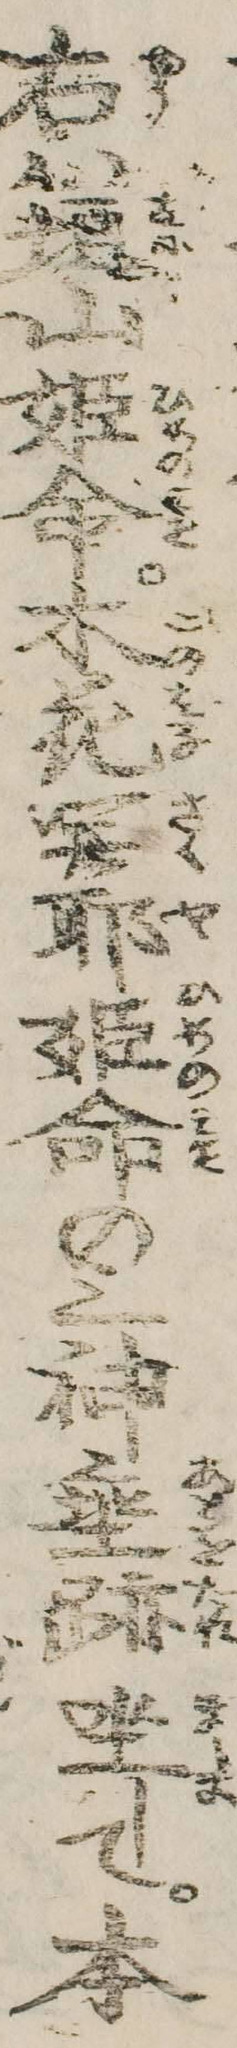右は埴山姫命。木花開耶姫命の三神垂跡坐して。本
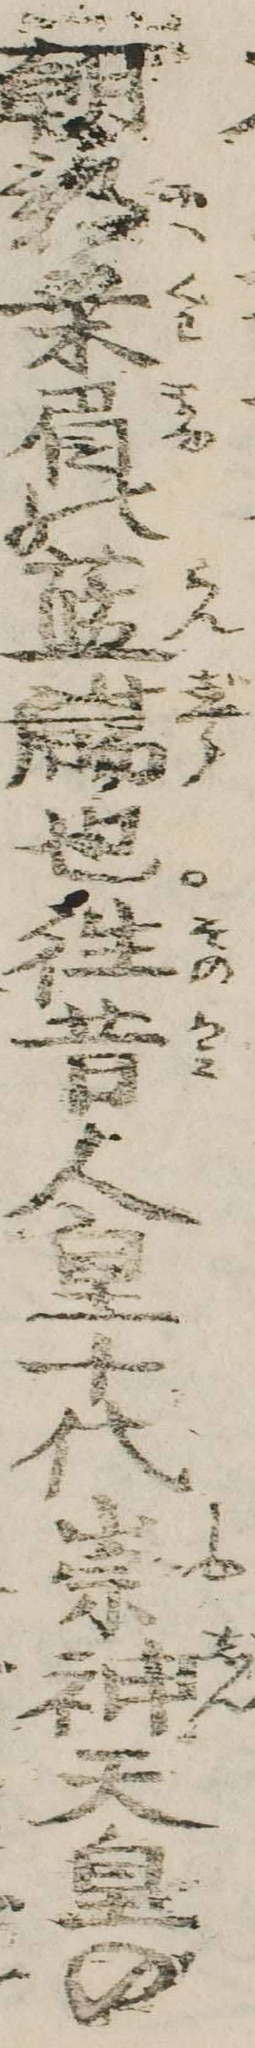朝贄桑眉の藍觴也。往昔人皇十代崇神天皇の
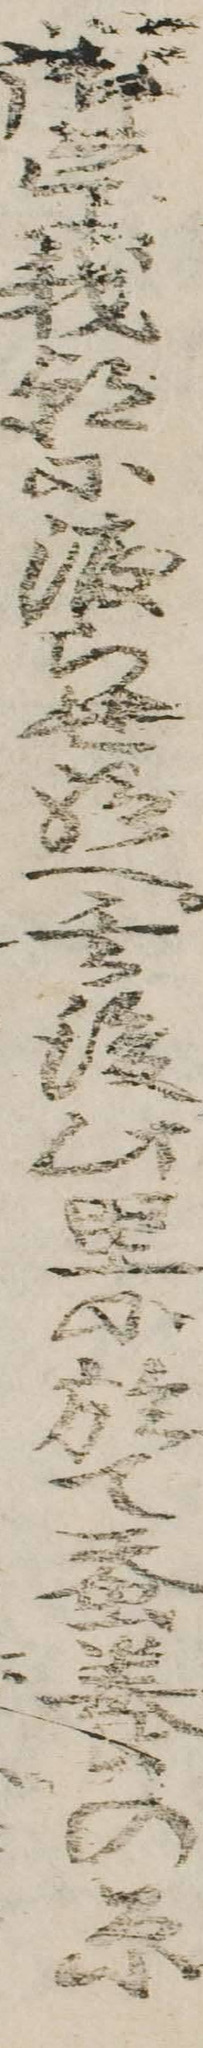御宇我朝に渡らせ給也。其後此里に於て蚕養の原
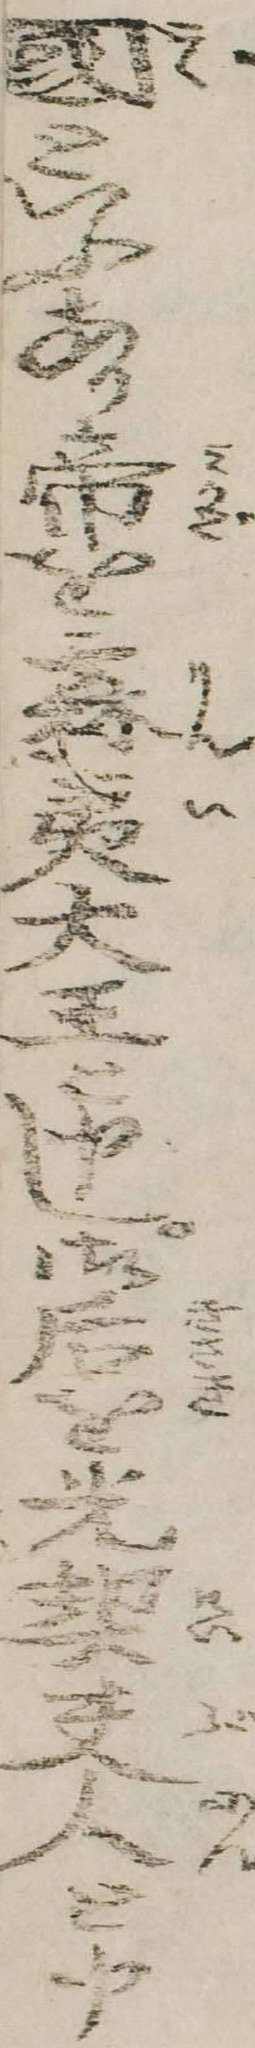国といふあり帝を霖夷大王と申し。御后を光契夫人と申

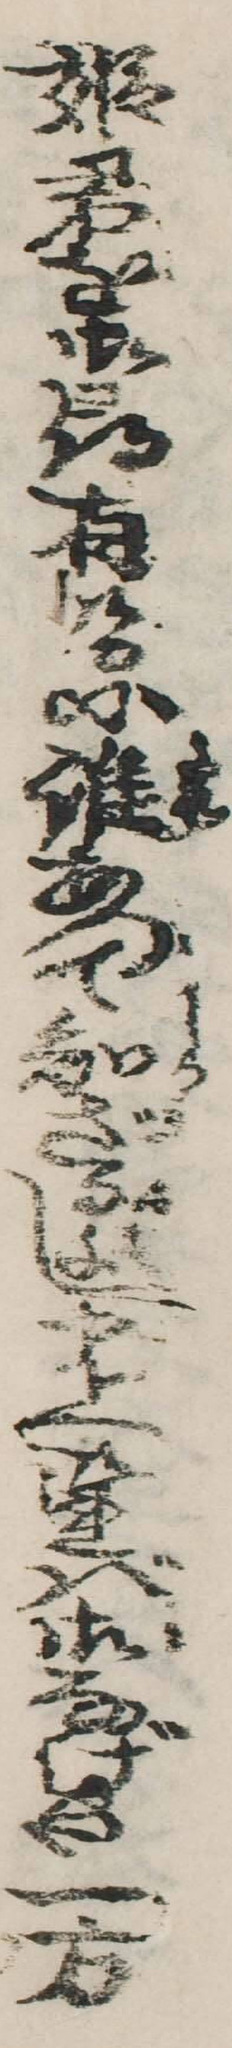姫君を御尋有けるに誰あつて知ざるよし申上ければ御なげき一方
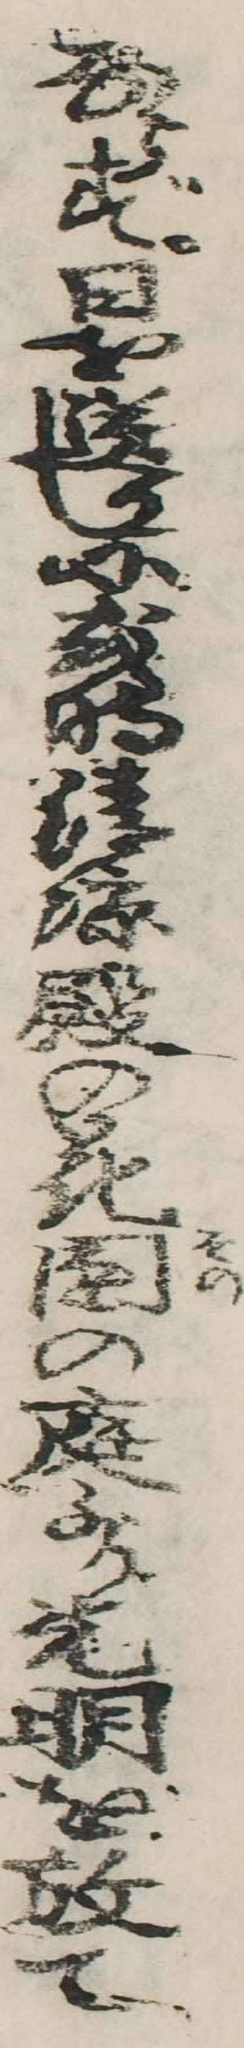ならず。日を送りしに或時清涼殿の花園の庭なか光明を放て
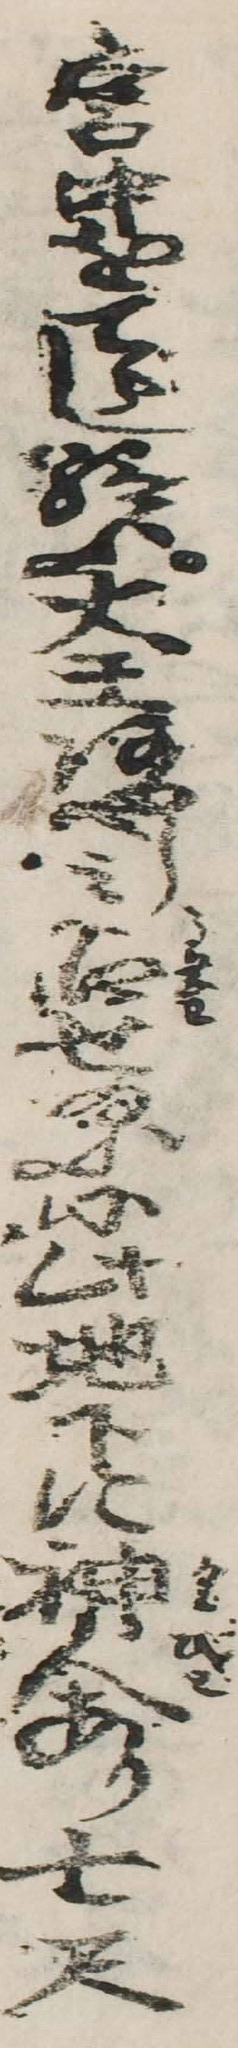宮中をてらし給ふ。大王あやしみ占せ給ふに此地下に神人あり七尺
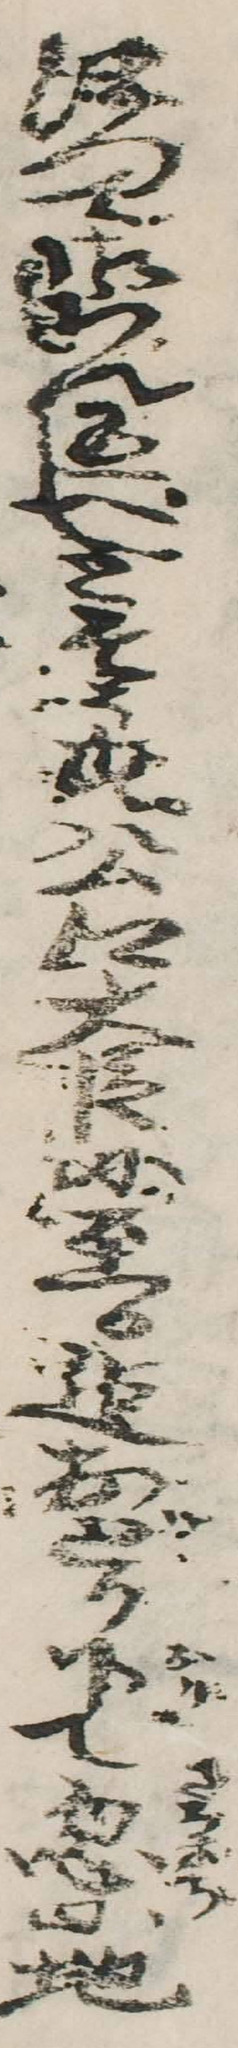ほつて御らん有べしとそうす。公卿大臣に至る迄おどり下て忽に地
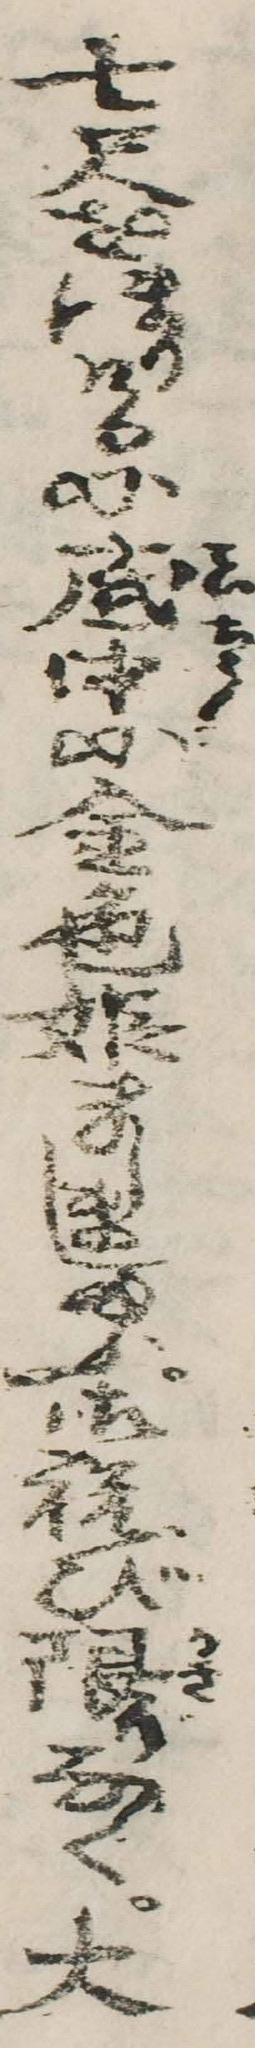七尺をほりけるに底中に金色姫まし給ふ。御悦び限りなく。大
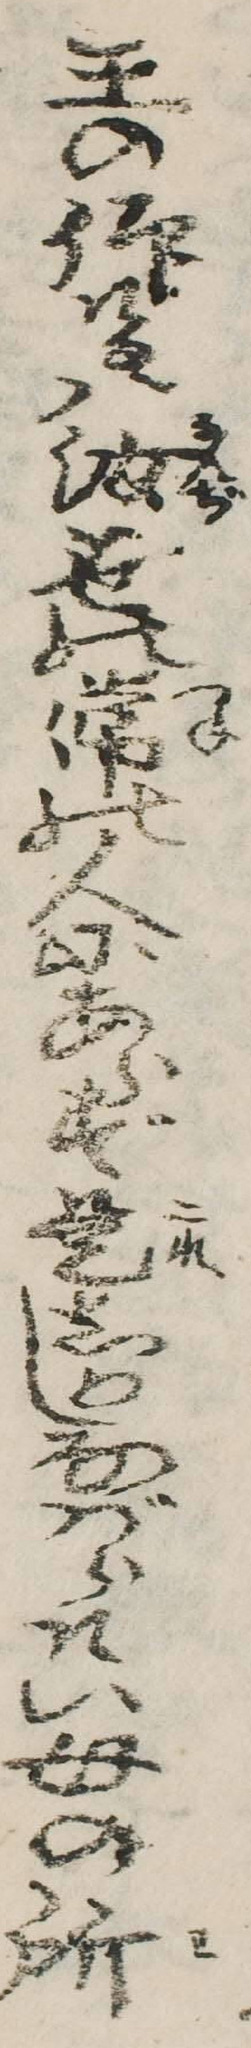王の仰けるは汝は世の常の人にあらず是しりながらけい母の所
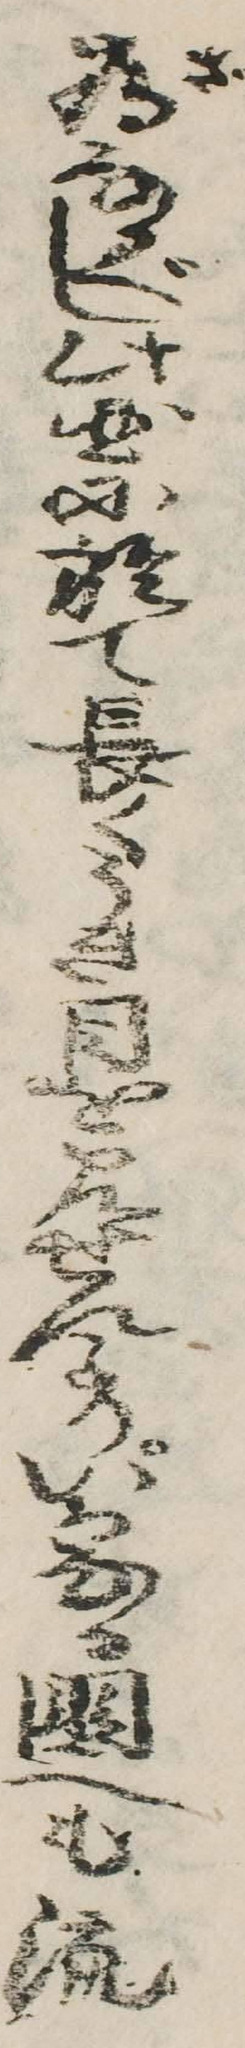為なるべし此国に於て長くうき目を見せんより。いかなる国へも流
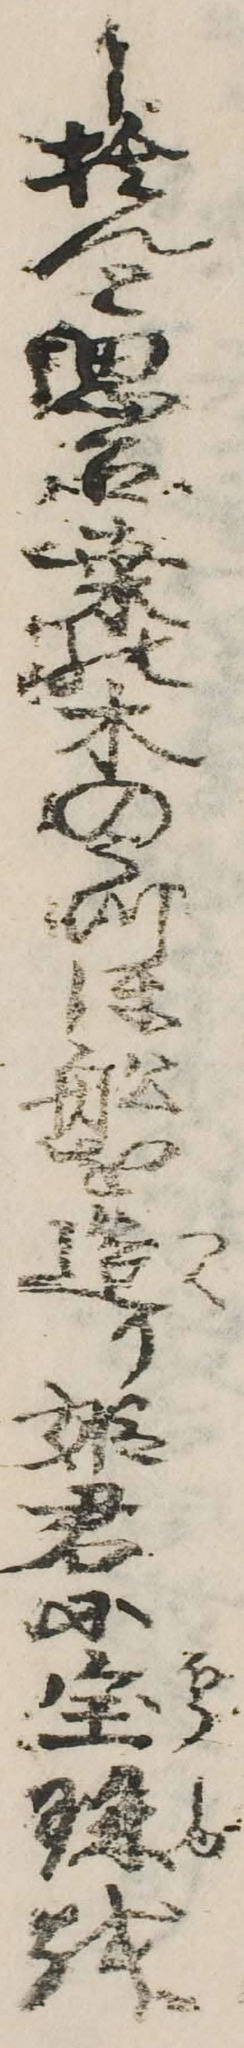し捨んと思召桑の木のうつほ船を造り姫君に宝珠を
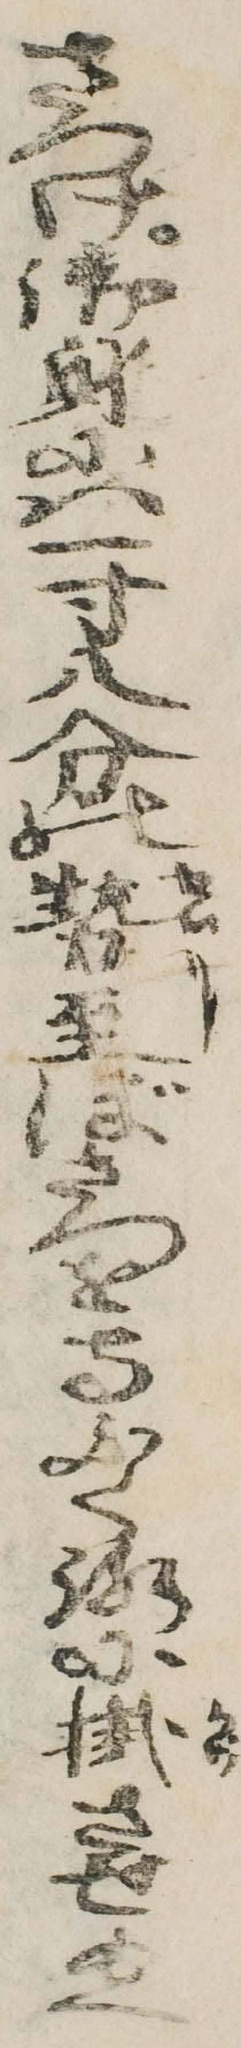さつけ。御身には一寸八分の勢至ぼさつを守ふくろに掛させ給へ
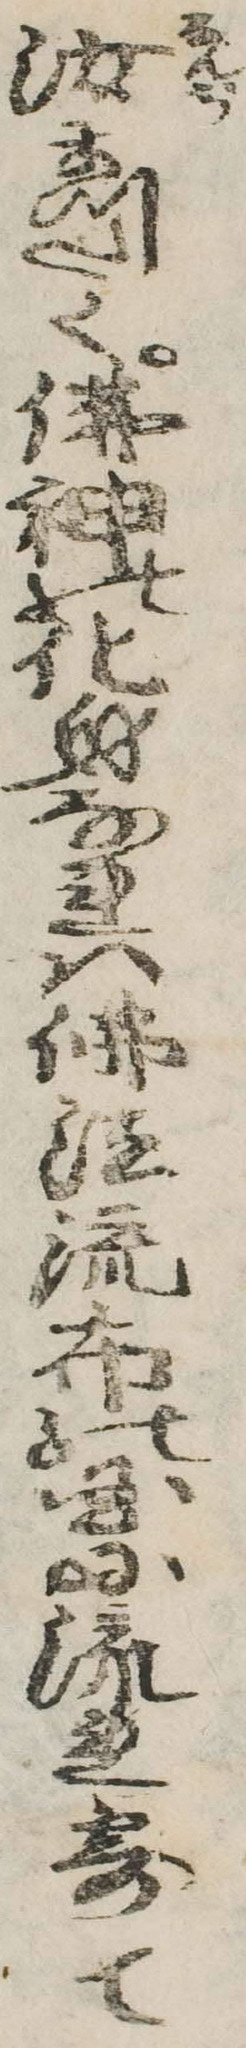汝まつたく。仏神の化身なれは仏法流布の国に流れ寄て
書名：蚕影山畧縁起
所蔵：国文学研究資料館
